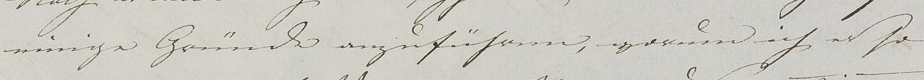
einige Gründe anzuführen, warum ich es so
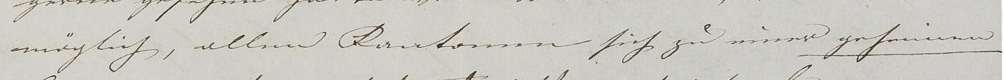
möglich, allen Kantonen sich zu einer geheimen
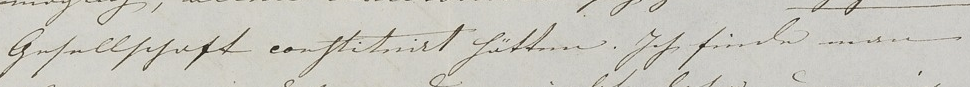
Gesellschaft constituirt hätten. Ich finde man
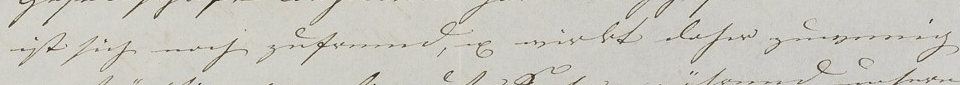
ist sich noch zufremd, & wirkt daher zuwenig
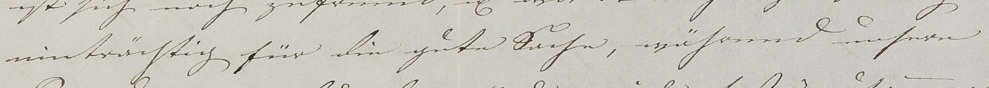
einträchtig für die gute Sache, während unsere
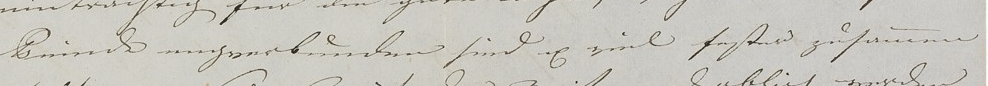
Feinde engverbunden sind & viel fester zusammen
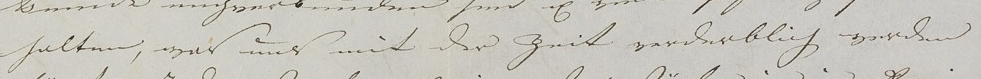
halten, was uns mit der Zeit verderblich werden
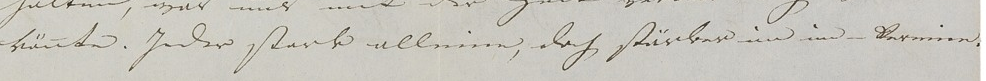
könnte. Jeder stark alleine, doch stärker im im – Vereine.
